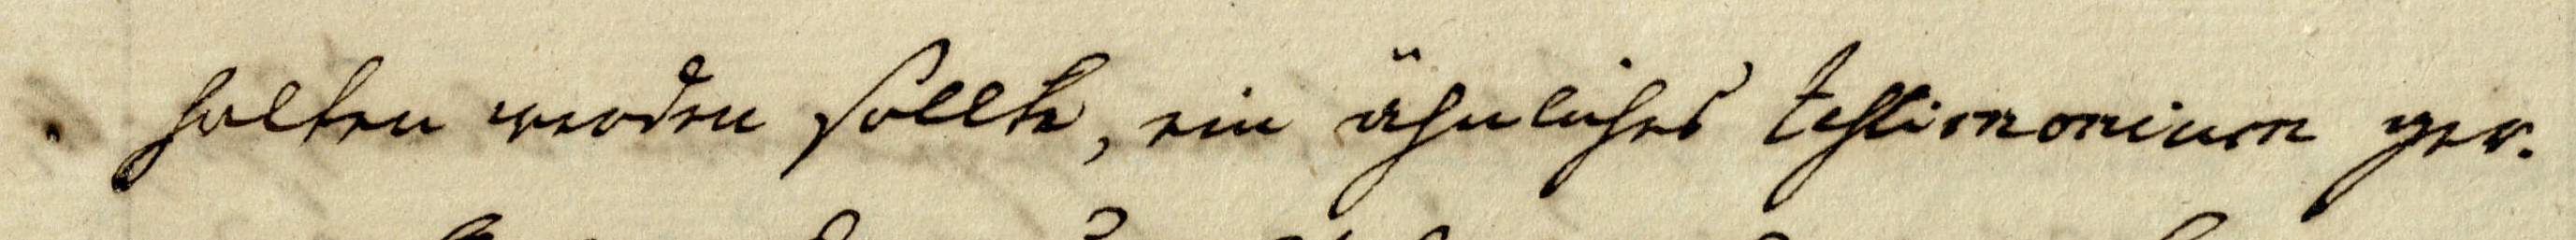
halten werden sollte, ein ähnliches testimonium ger¬
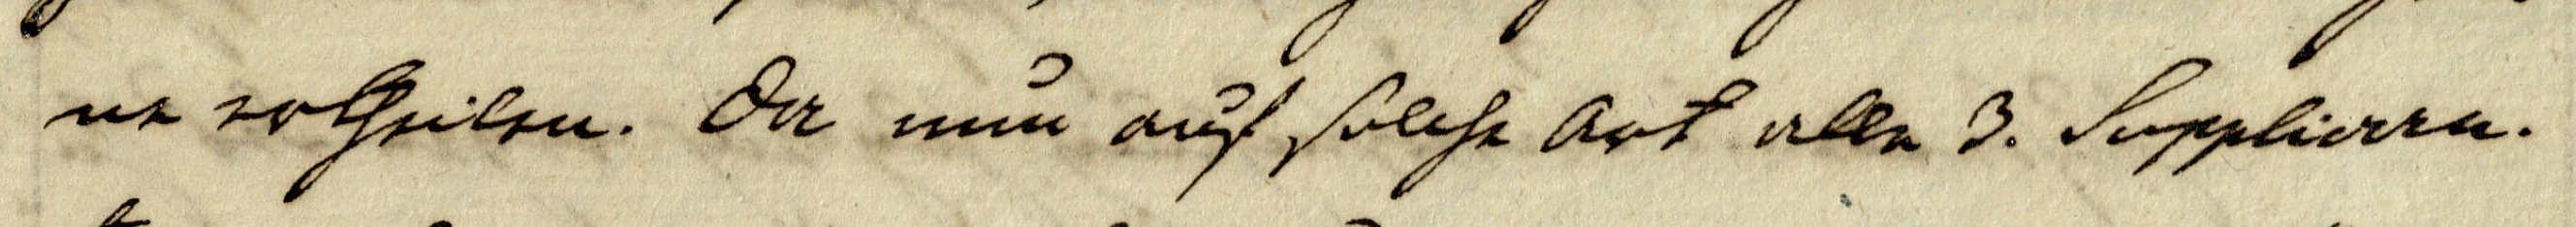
ne ertheilen. Da nun auf solche Art alle 3. Supplican¬
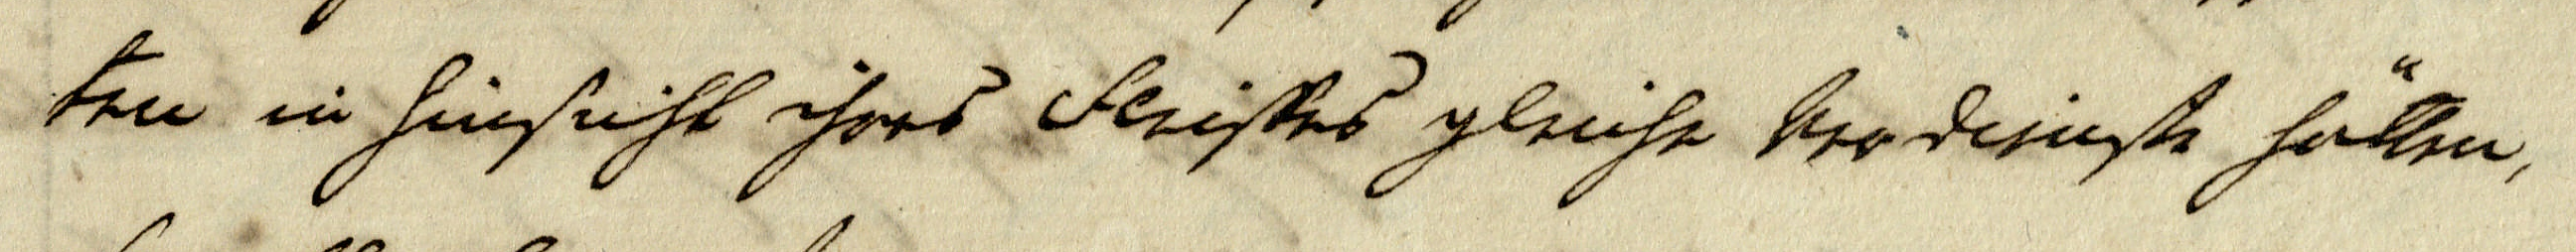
ten in Hinsicht ihres Fleisses gleiche Verdienste hätten,
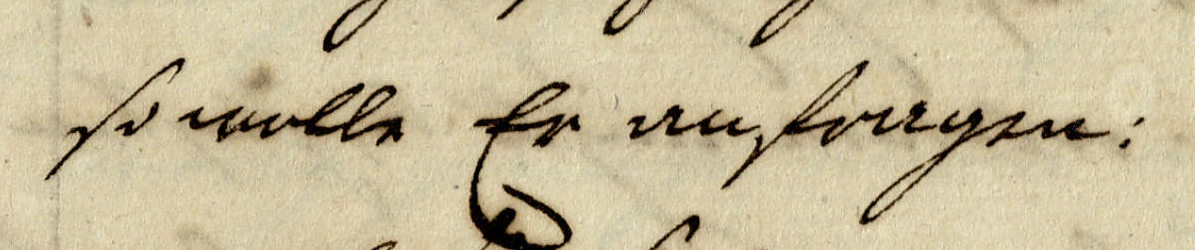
so wolle Er anfragen:
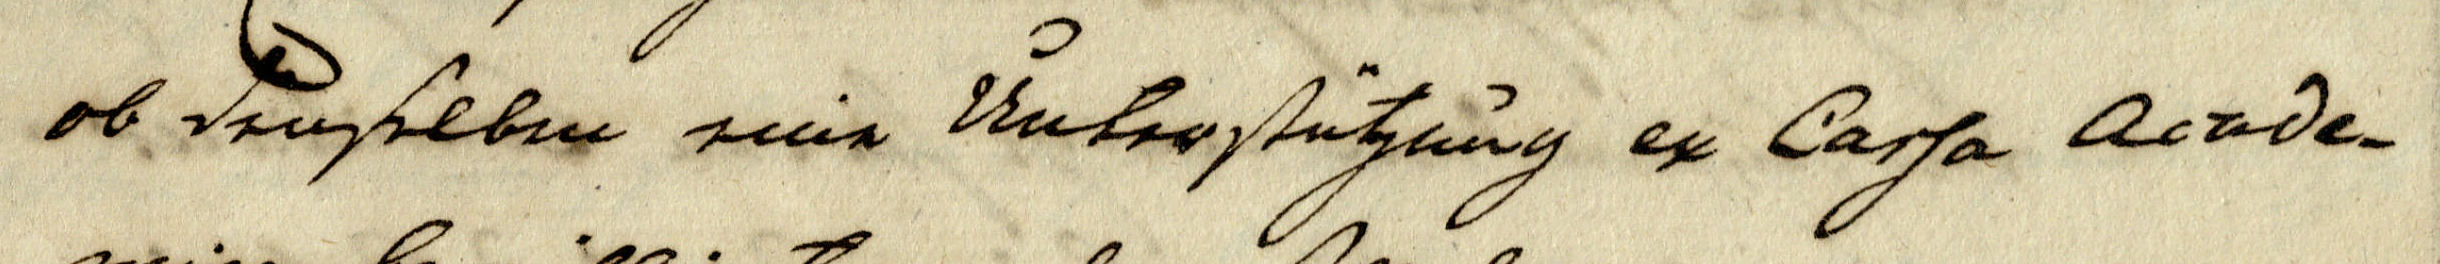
ob denselben eine Unterstützung ex Cassa Acade¬
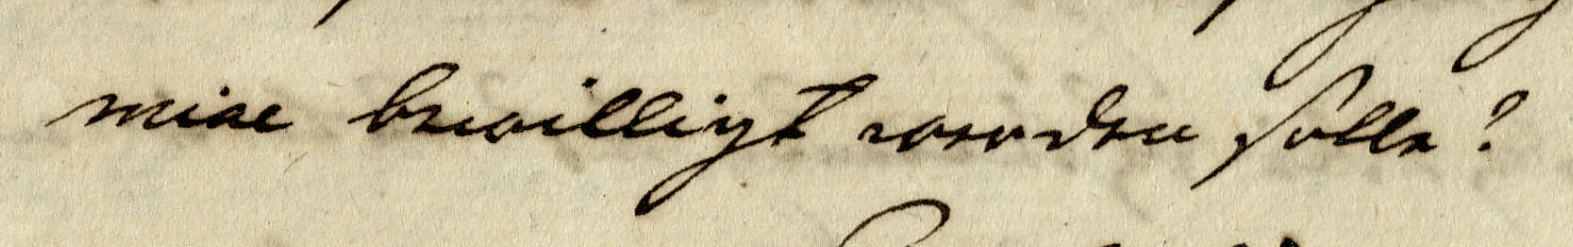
miae bewilligt werden solle?
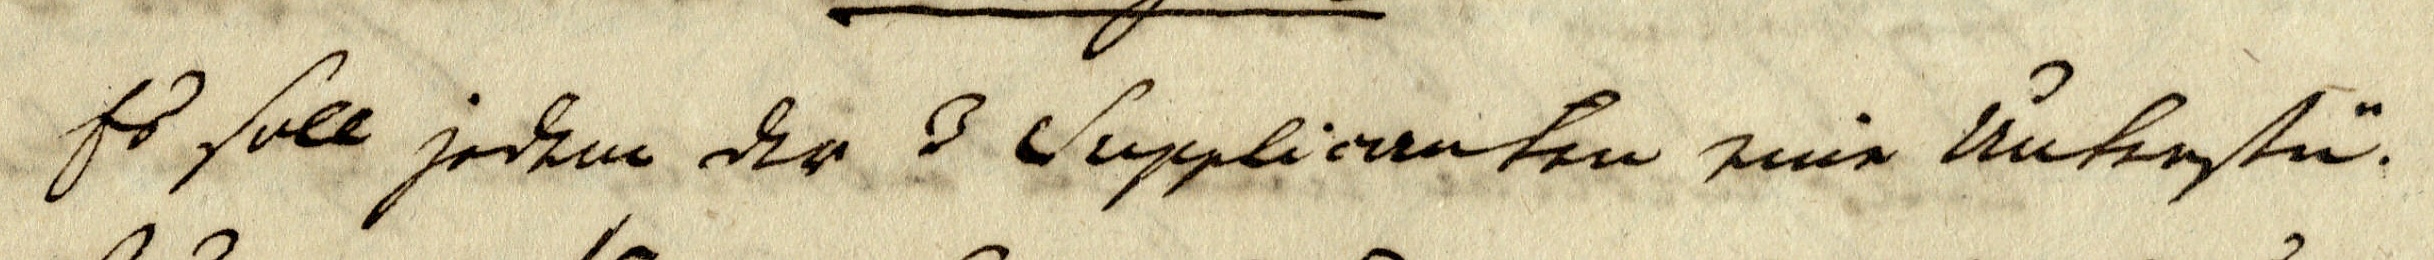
Es soll jedem der 3 Supplicanten eine Unterstü¬
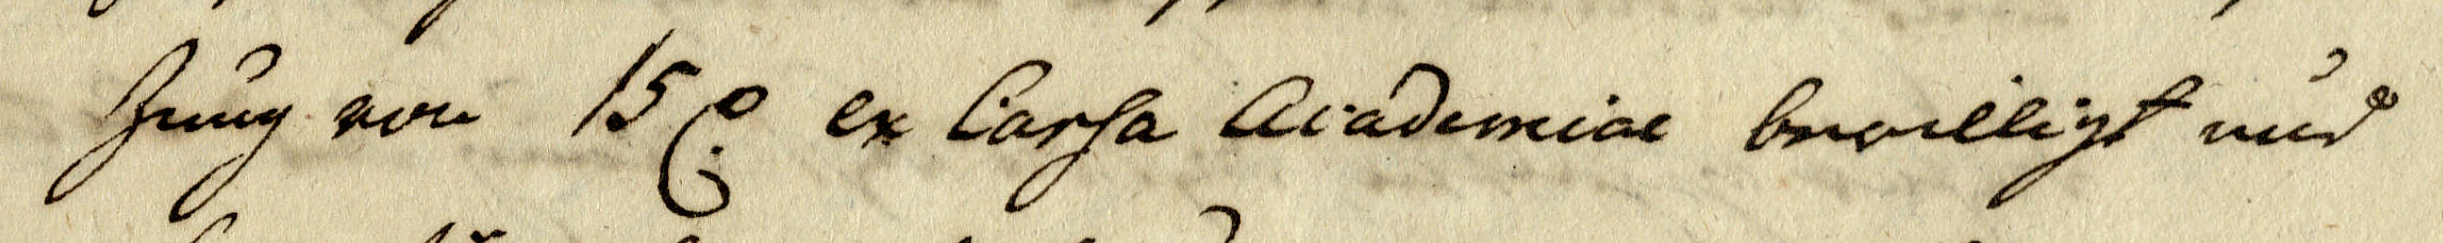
tzung von 15 l. ex Cassa Academiae bewilligt und
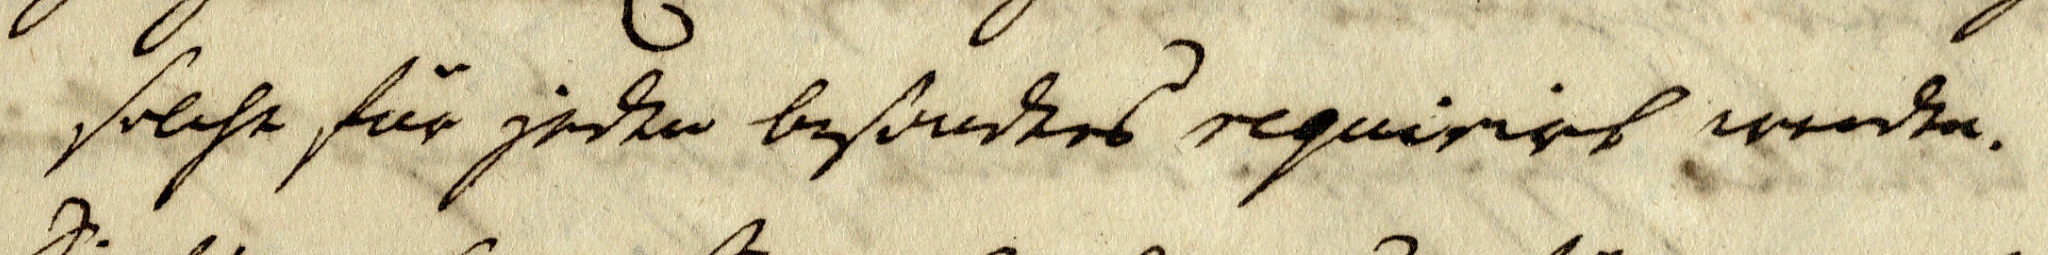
solche für jeden besonders requirirt werden.
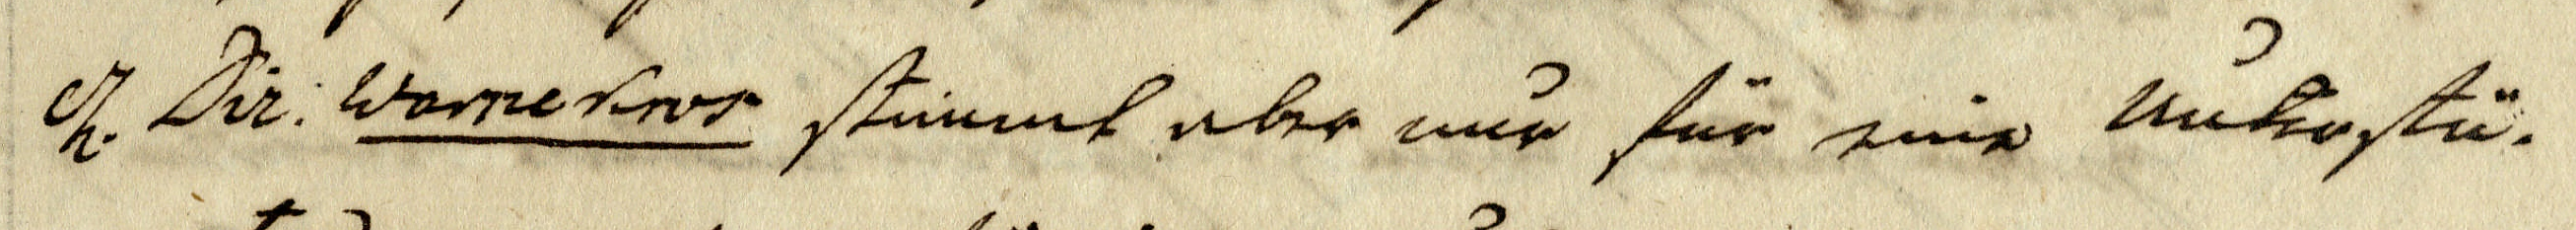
dh. Dir. Warnekros stimmt aber nur für eine Unterstü¬
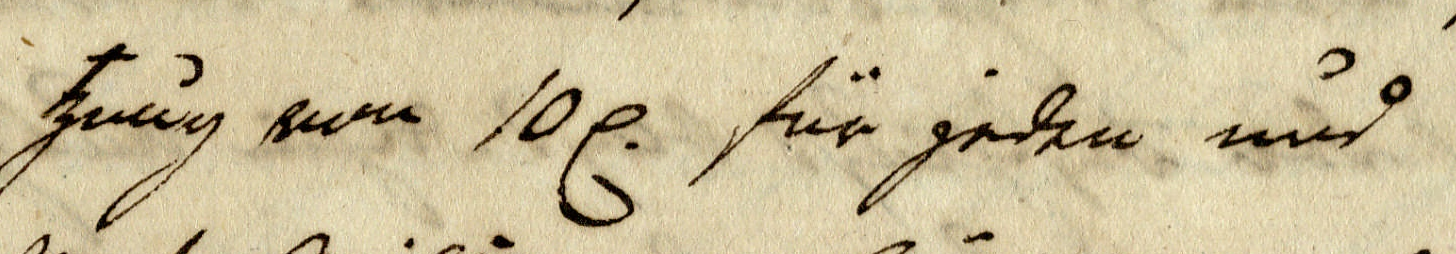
tzung von 10 l. für jeden und
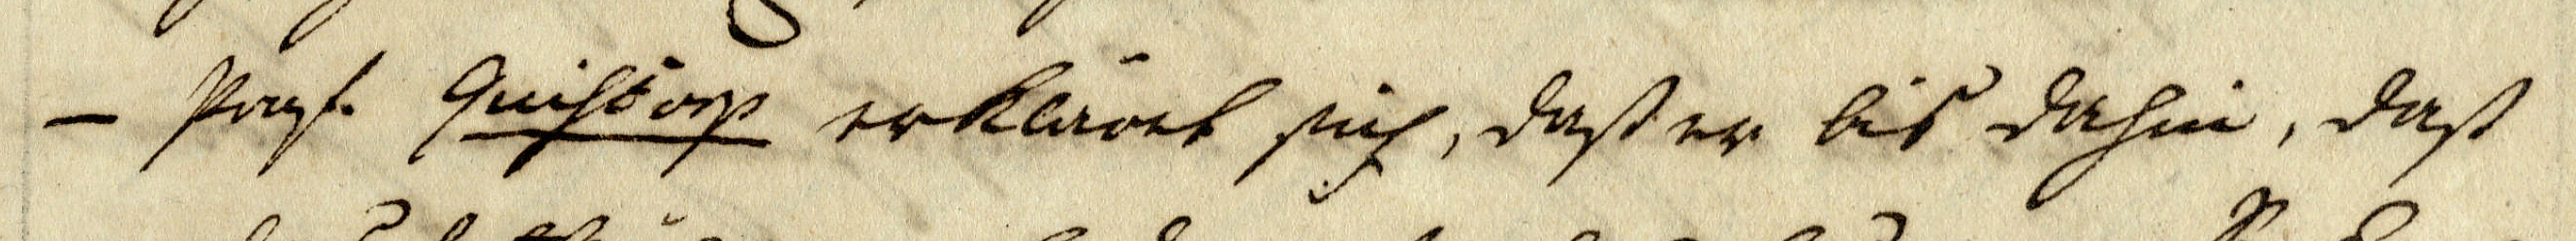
Prof. Quistorp erkläret sich, daß er bis dahin, daß
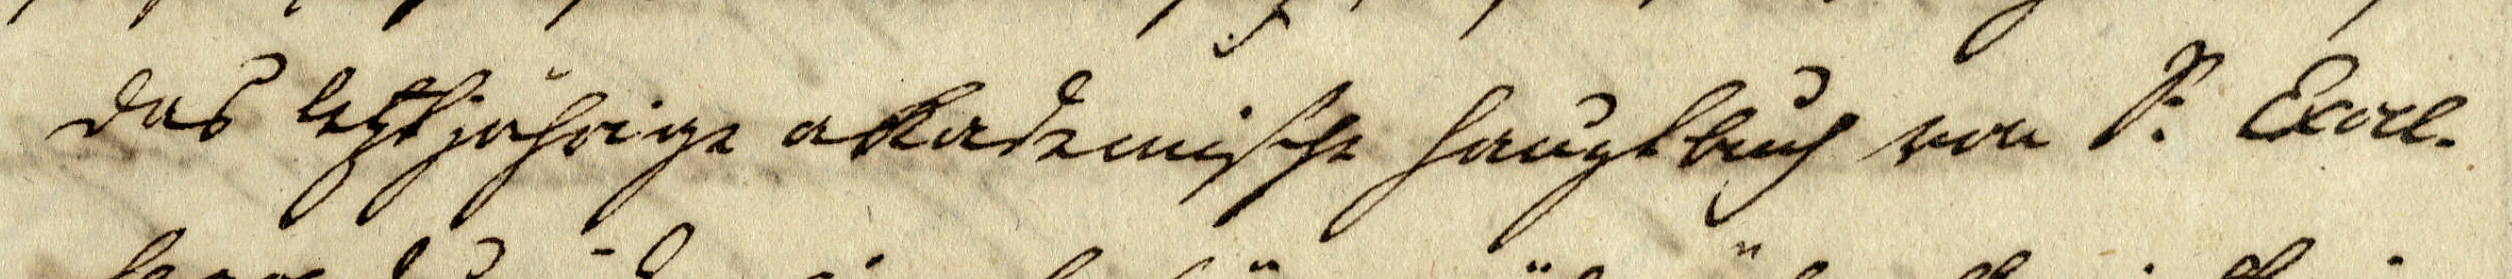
das letztjährige akademische Hauptbuch von S. Excel¬
